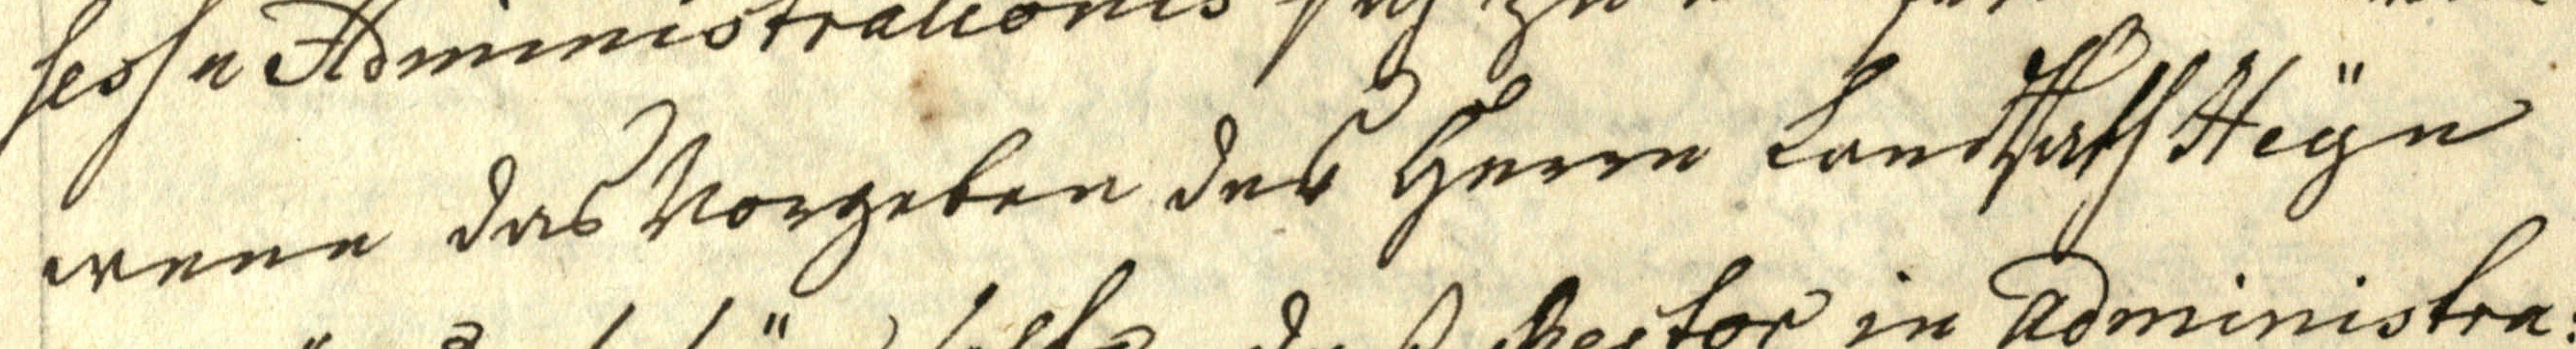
wenn das Vorgeben des Herrn LandRath Heÿn
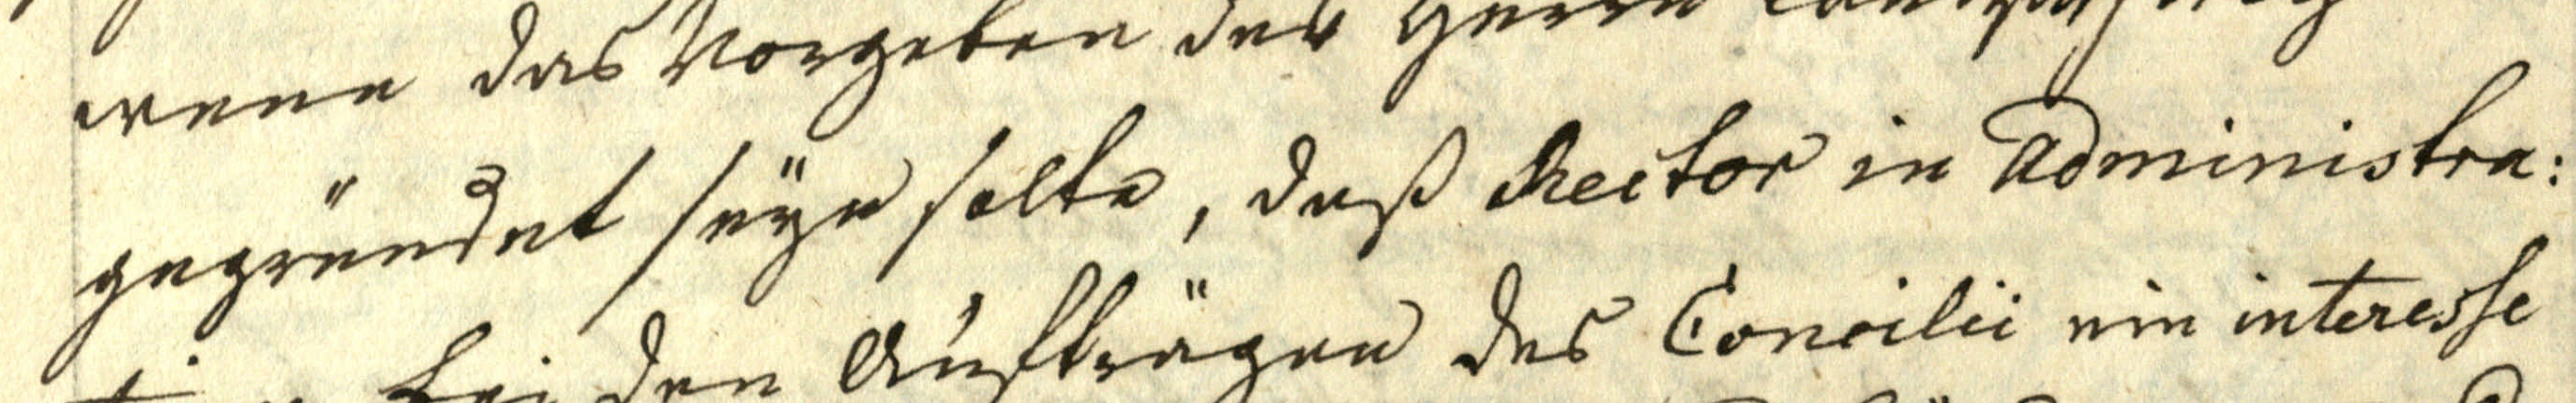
gegründet seÿn solte, daß Rector in Administra¬
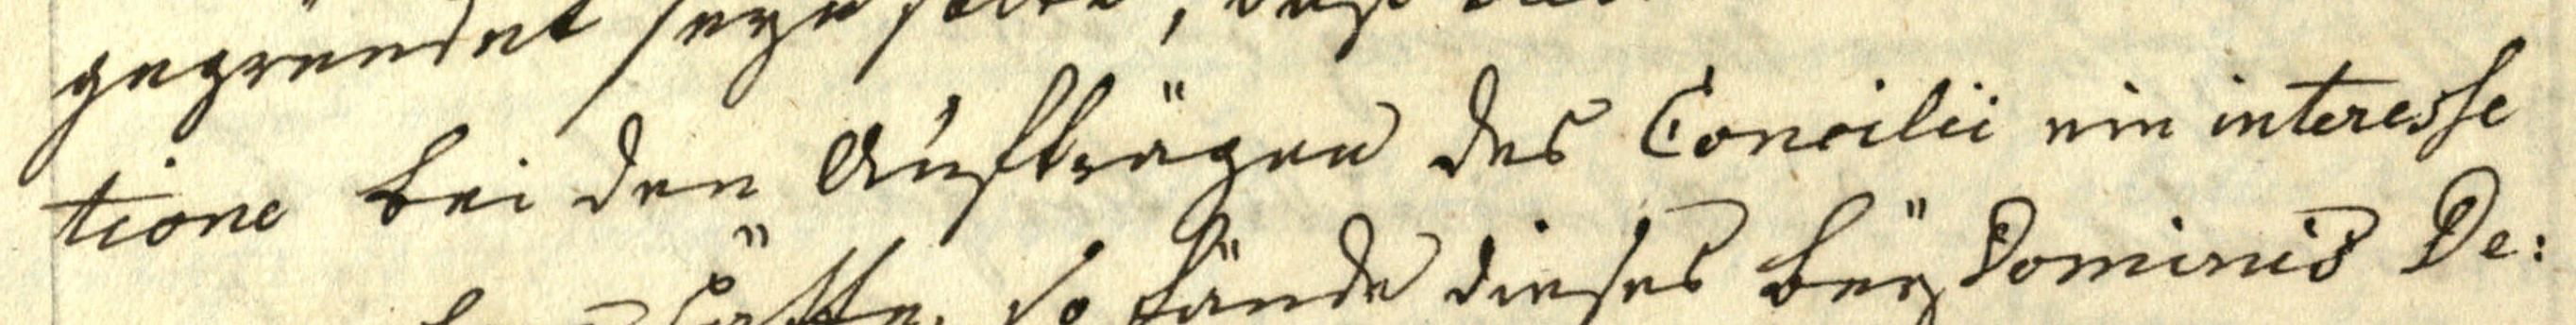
tione bei den Aufträgen des Concilii ein interesse
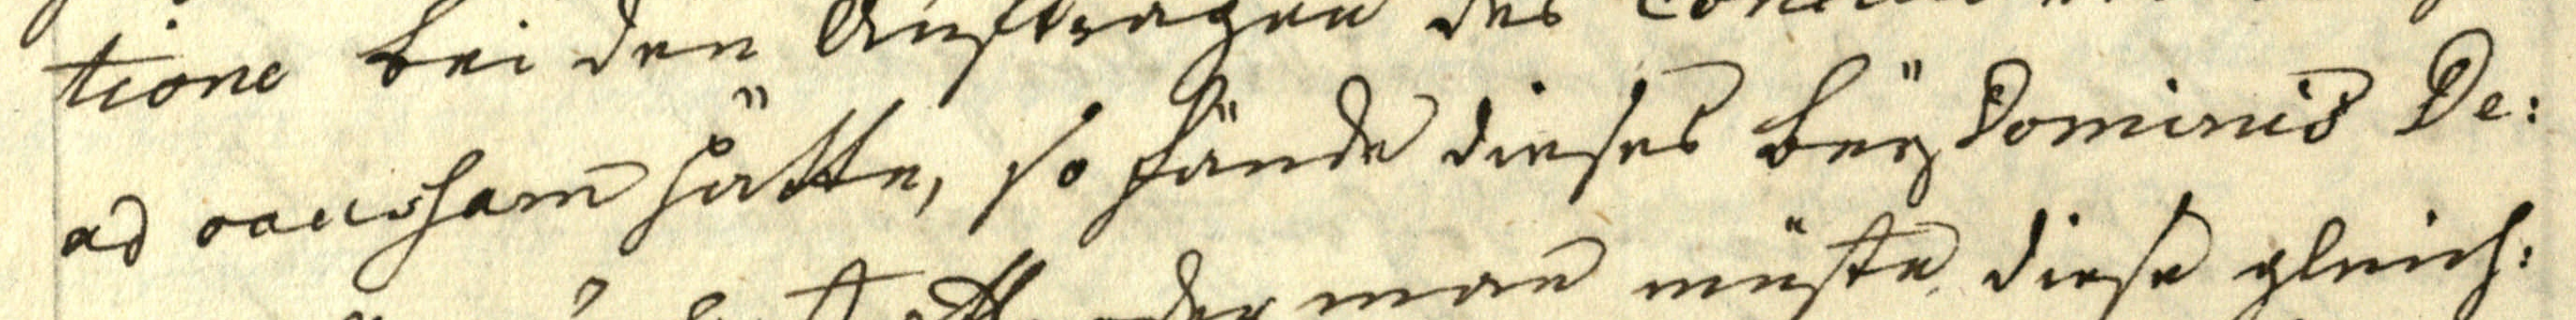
ad caussam hätte, so fände dieses beÿ Dominis De¬
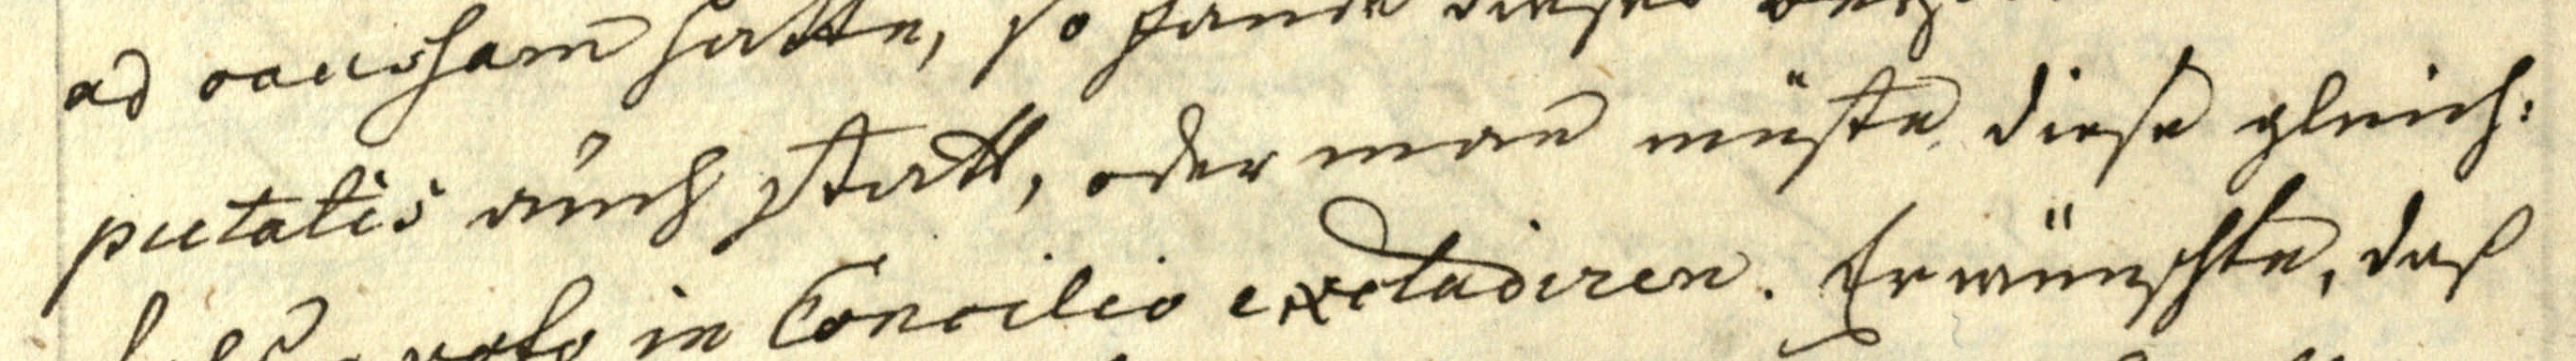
putatis auch statt, oder man müste diese gleich¬
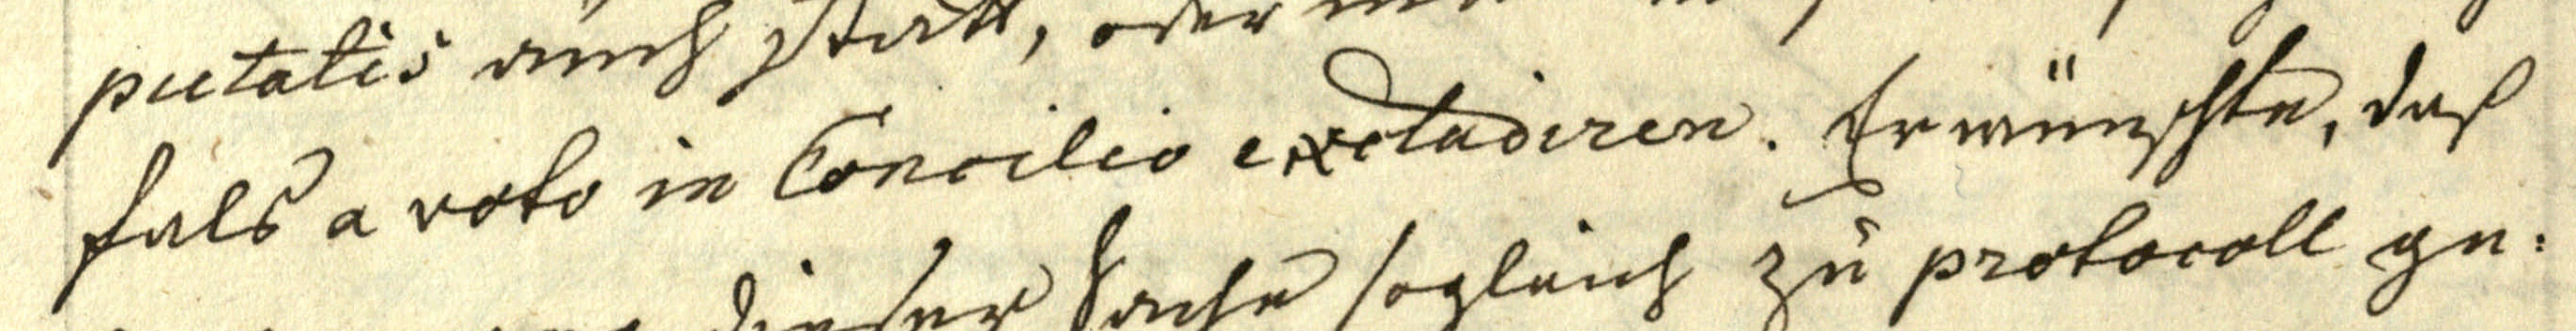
fals voto in Concilio excludiren. Er wünschte, daß
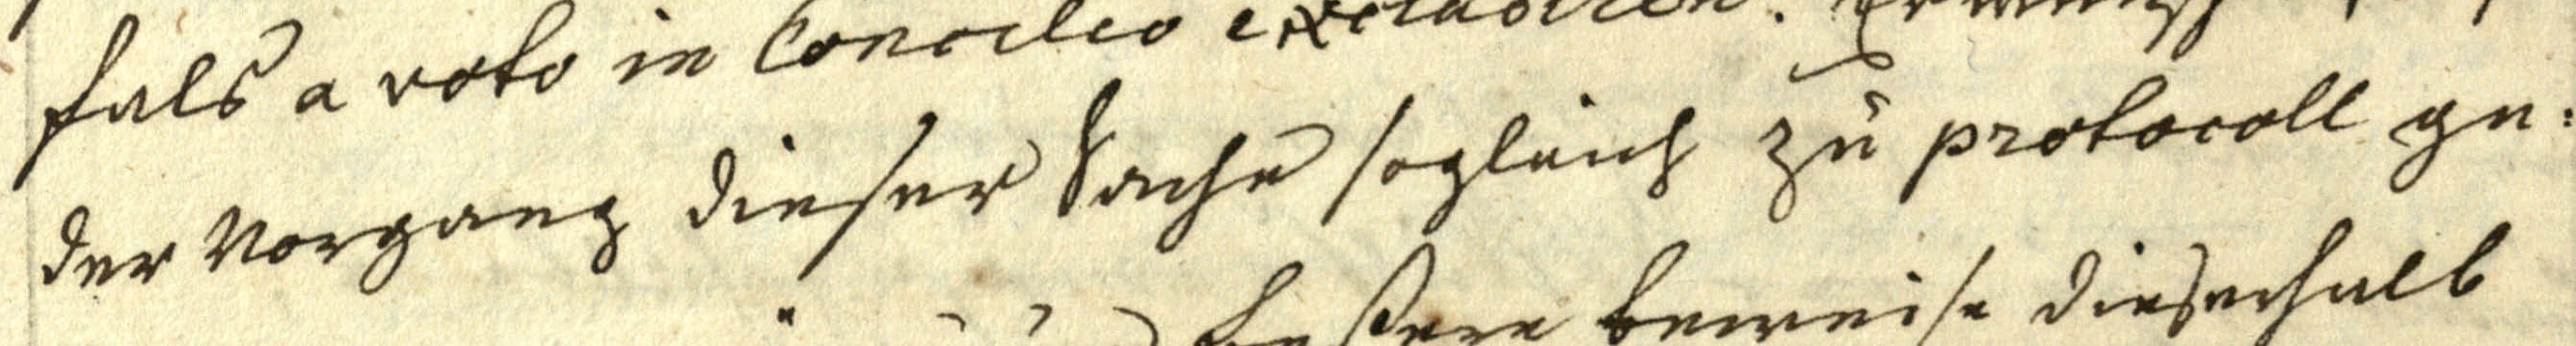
der Vorgang dieser Sache sogleich zu protocoll ge¬
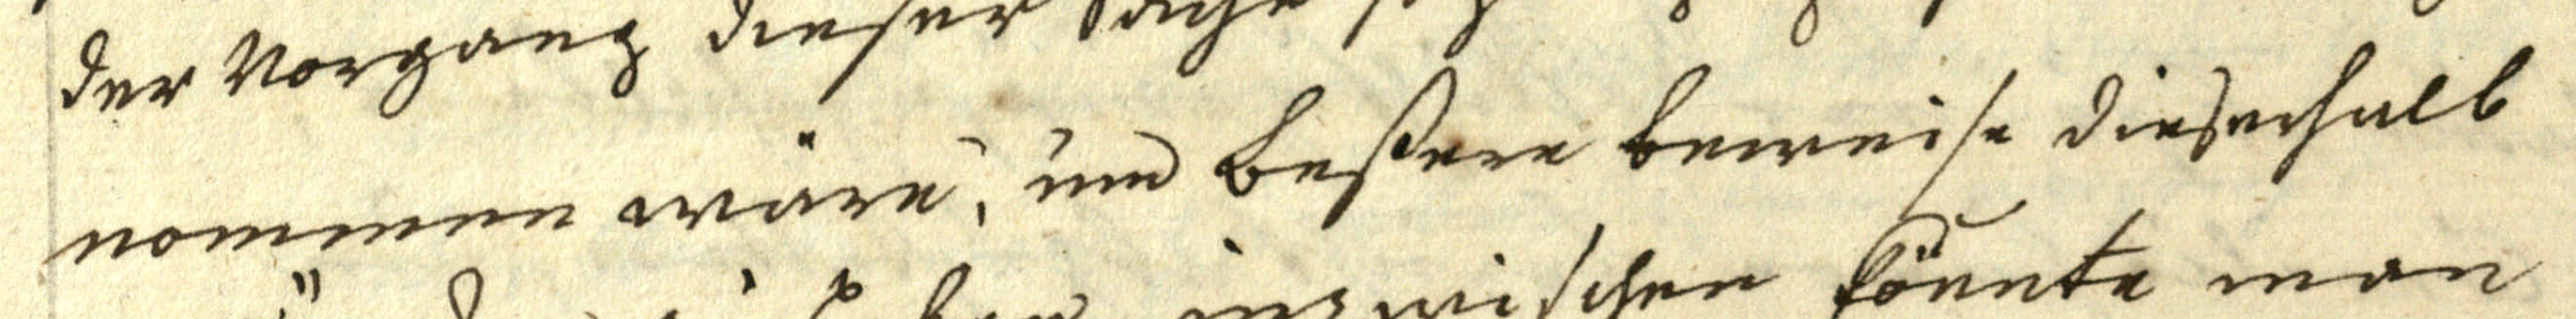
nommen wäre, und beßere Beweise dieserhalb
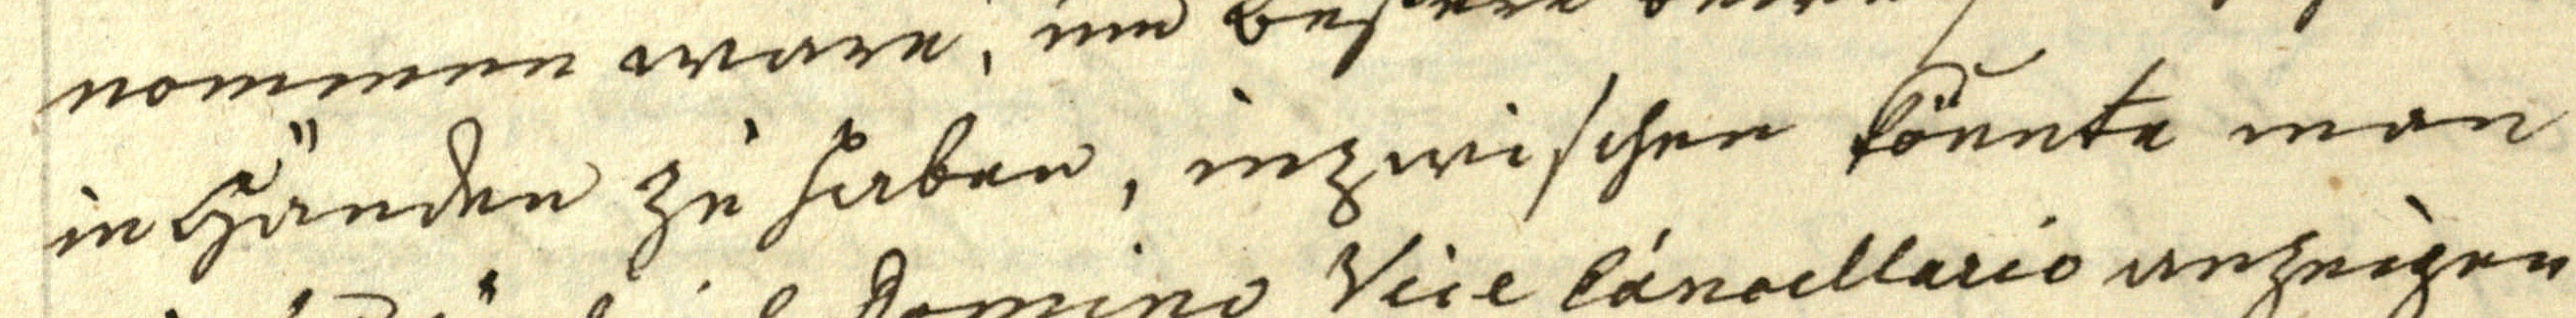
in Händen zu haben, inzwischen könnte man
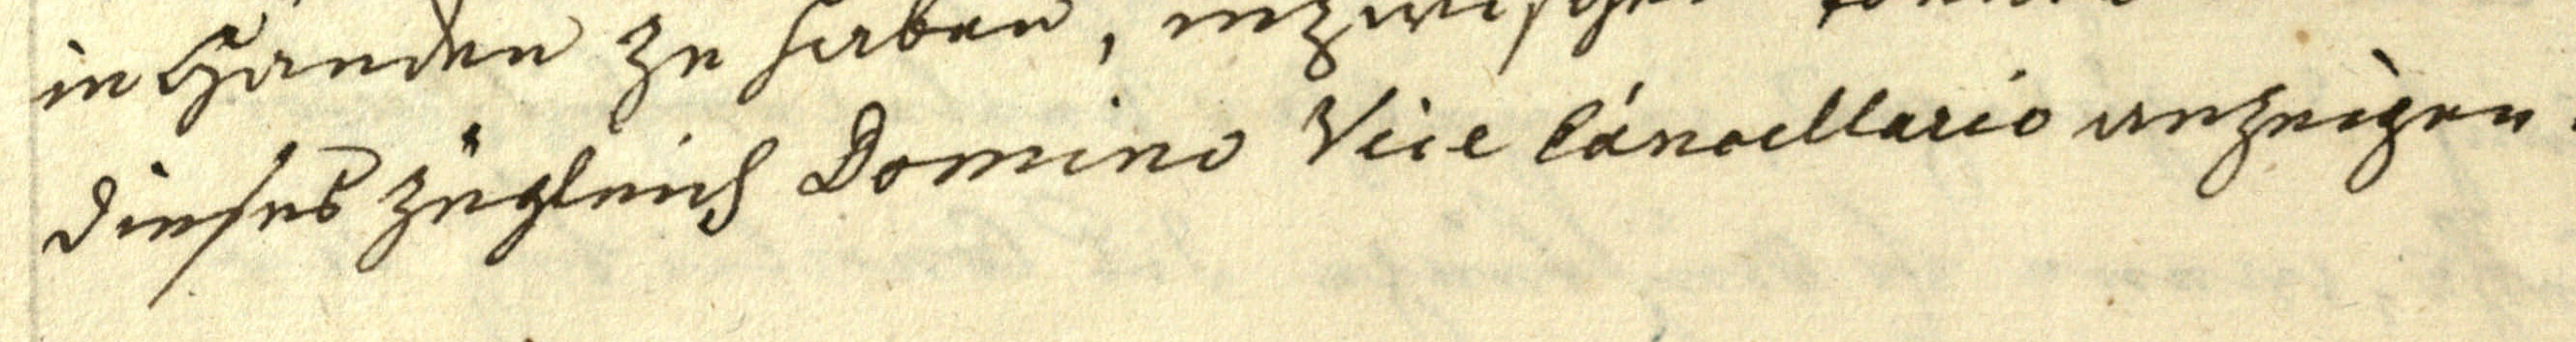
dieses zugleich Domino Vice Cancellario anzeigen.
